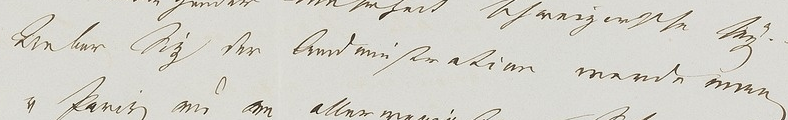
Ueber Siz der Administration werde man
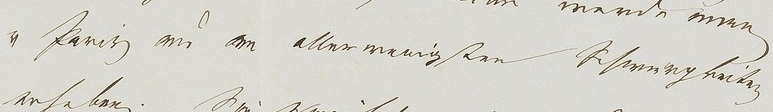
v Paris aus am allerwenigsten Schwierigkeiten
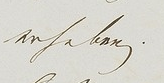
erheben.
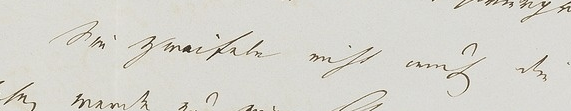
Sie zweifeln nicht auch die
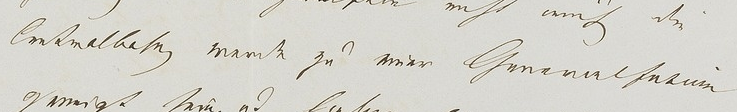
Centralbahn werde zu einer Generalfusion
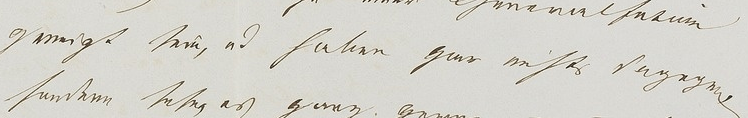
geneigt sein, u. haben gar nichts dagegen,
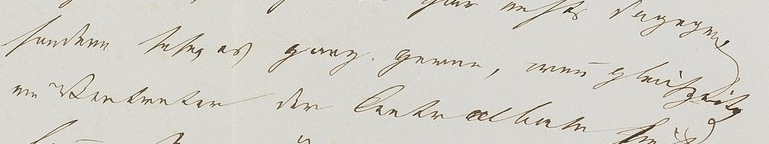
sondern sehen es ganz gerne, wenn gleichzeitig
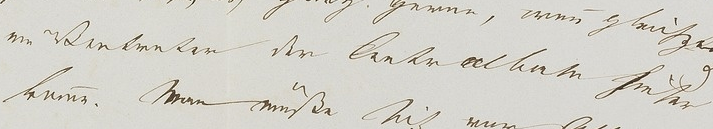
ein Vertreter der Centralbahn hieher
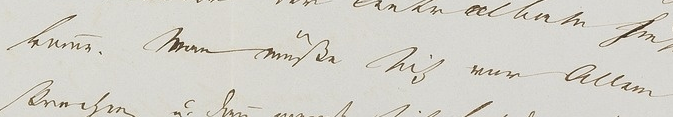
komme. Man müße sich vor Allem
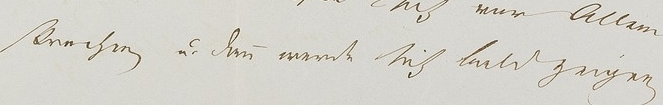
sprechen u. dann werde sich bald zeigen
